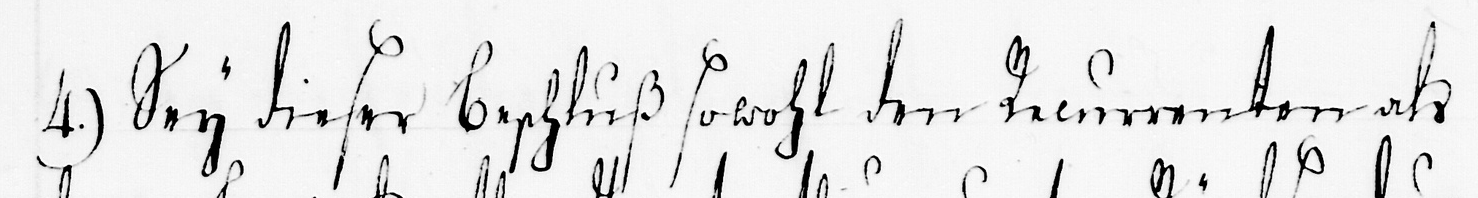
4.) Sey dieser Beschluß sowohl den Recurrenten als
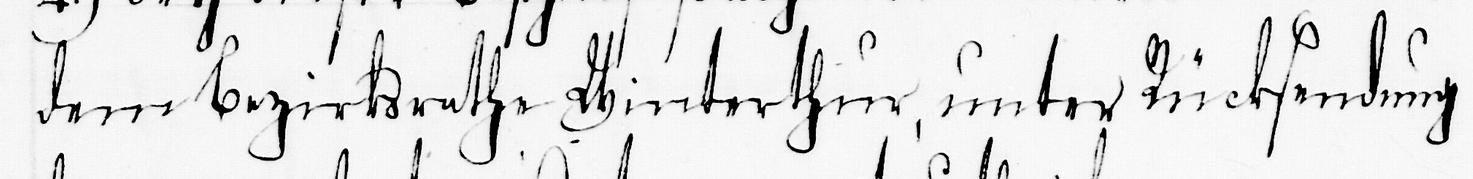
dem Bezirksrathe Winterthur, unter Rücksendung
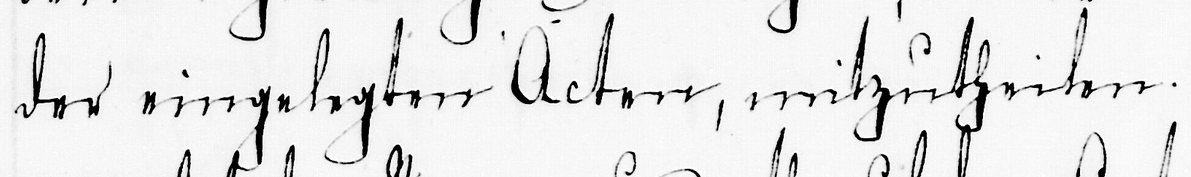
der eingelegten Acten, mitzutheilen.
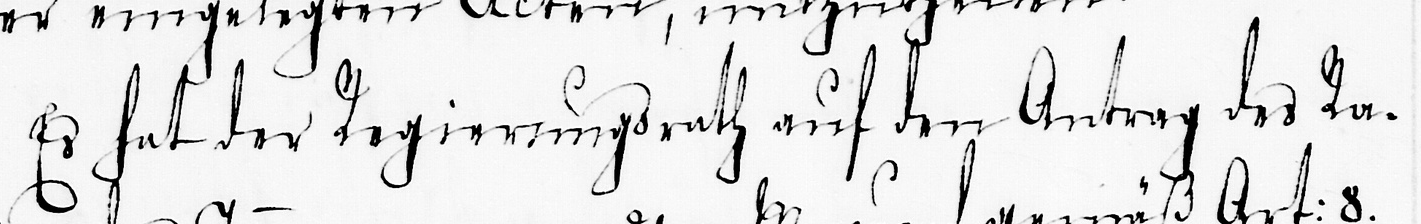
Es hat der Regierungsrath auf den Antrag des Ra¬
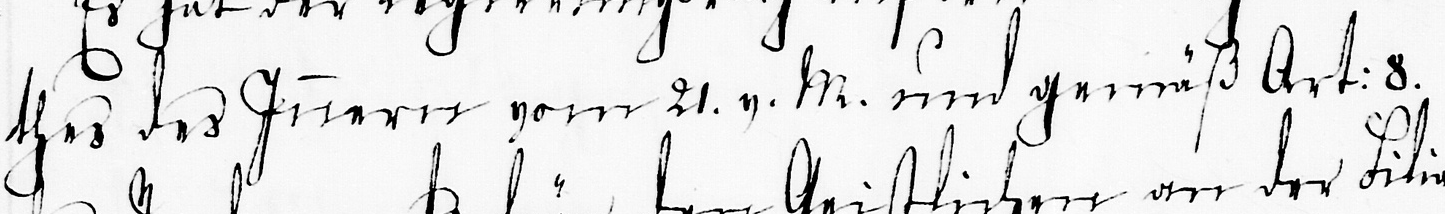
thes des Innern vom 21. v. M. und gemäß Art: 8.
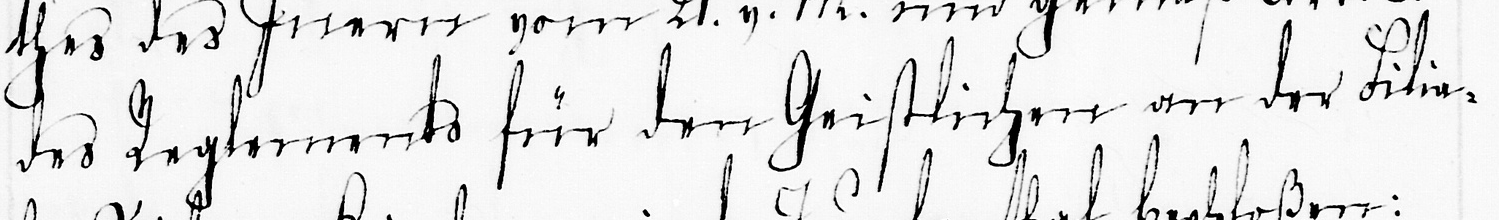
des Reglements für den Geistlichen an der Filia¬
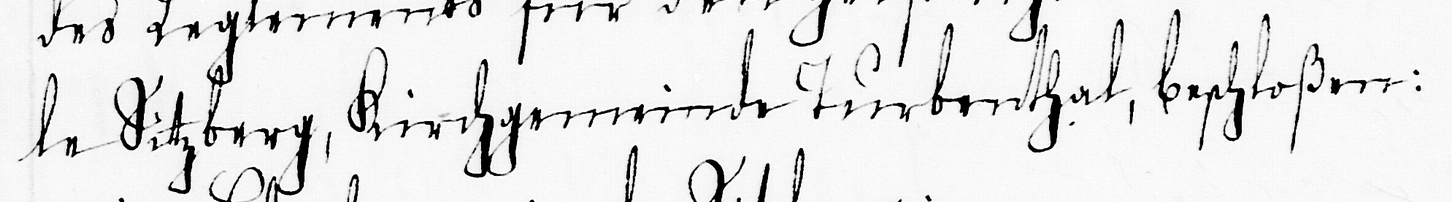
le Sitzberg, Kirchgemeinde Turbenthal, beschloßen:
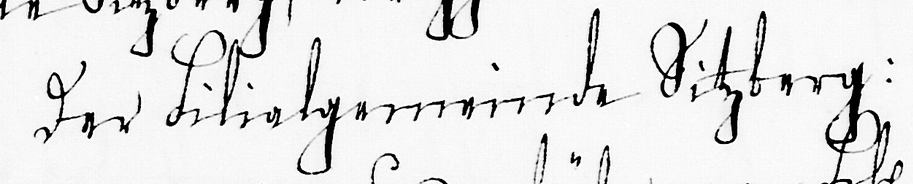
Der Filialgemeinde Sitzberg:
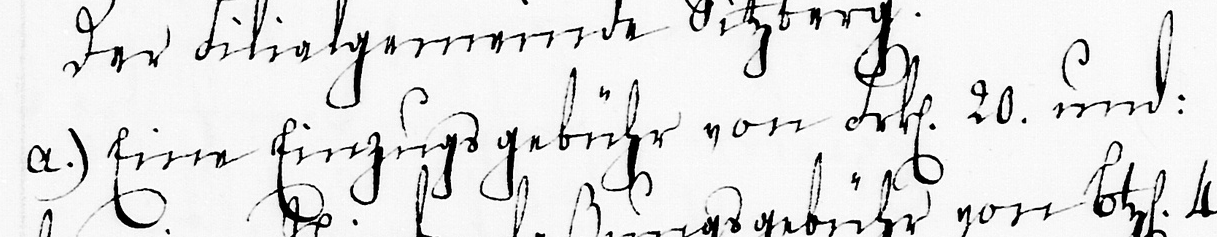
a.) Eine Einzugsgebühr von Frk[en]. 20. und:
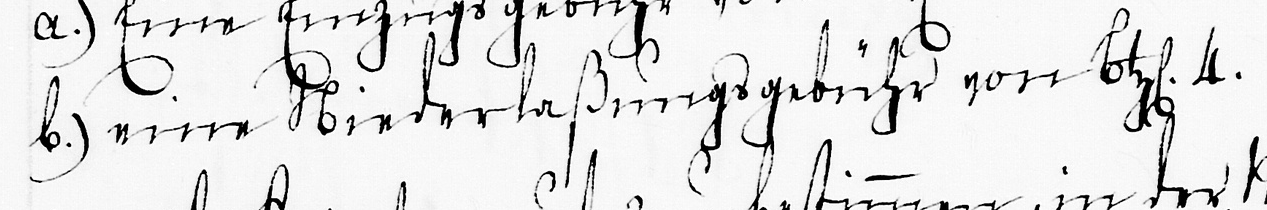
b.) eine Niederlaßungsgebühr von Btz[en].
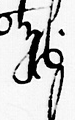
4.
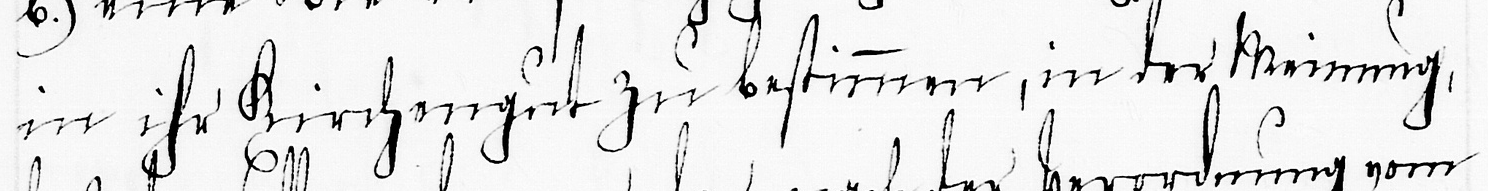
in ihr Kirchengut zu bestimmen, in der Meinung,
